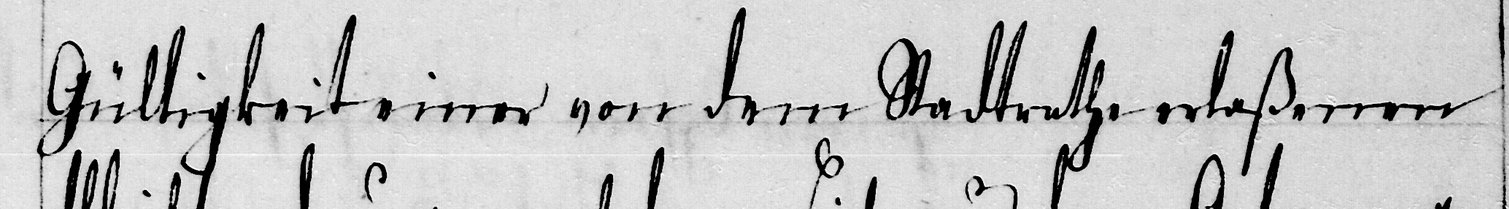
Gültigkeit einer von dem Stadtrathe erlaßenen
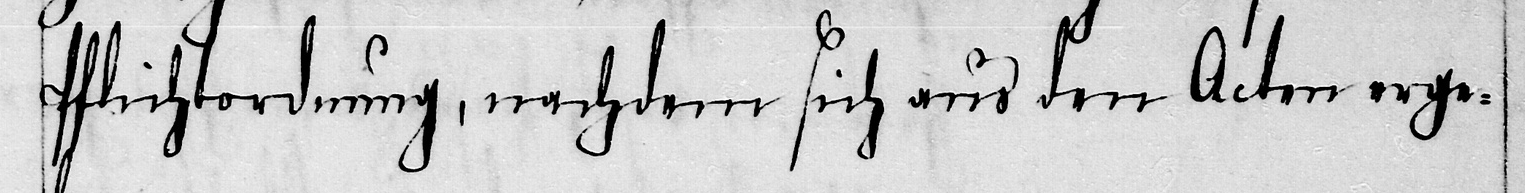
Pflichtordnung, nachdem sich aus den Acten erge¬
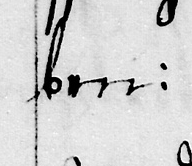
ben:
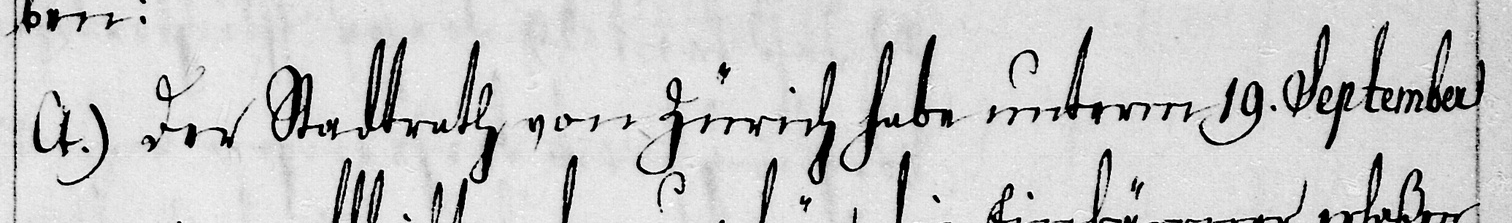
A.) Der Stadtrath von Zürich habe unterm 19. September
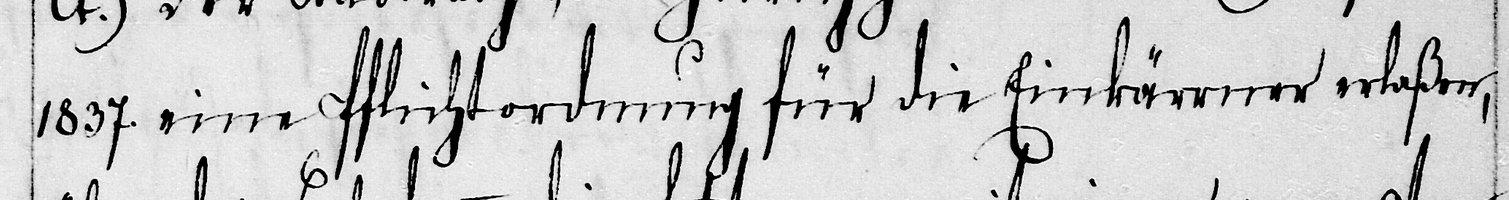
1837. eine Pflichtordnung für die Einkärrner erlaßen,
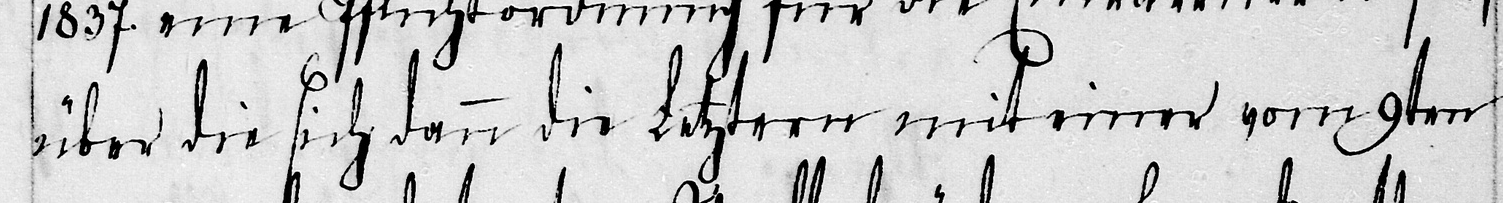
über die sich dann die Letztern mit einer vom 9ten
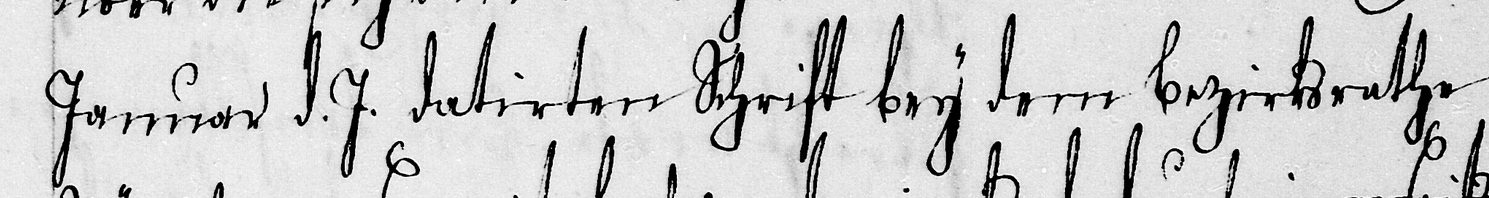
Januar d. J. datirten Schrift bey dem Bezirksrathe
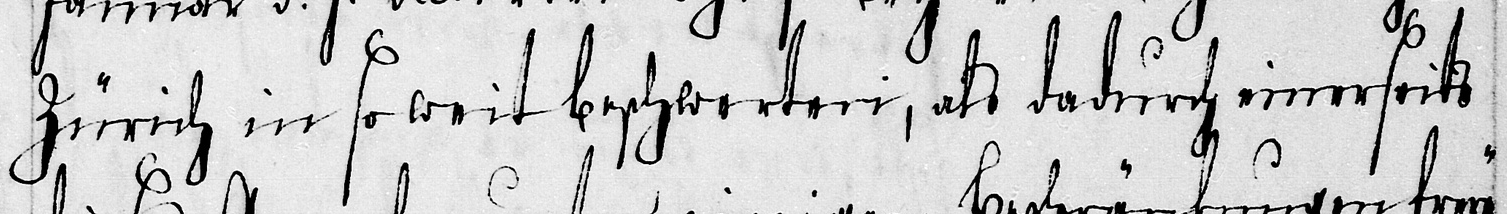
Zürich in so weit beschwerten, als dadurch einerseits
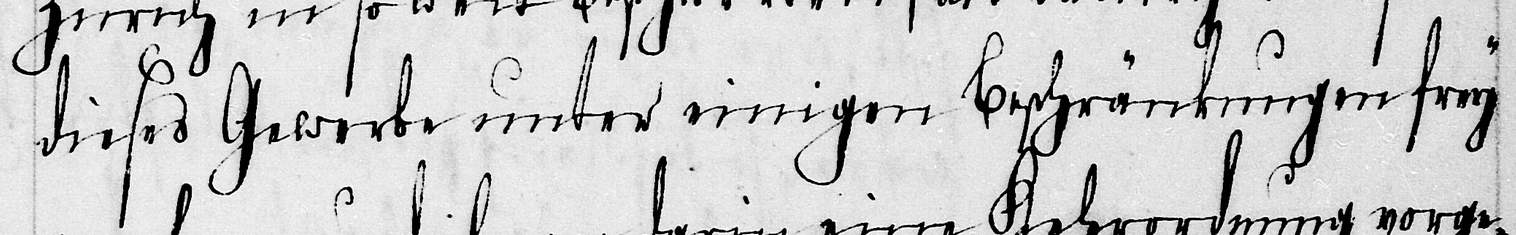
dieses Gewerbe unter einigen Beschränkungen frey
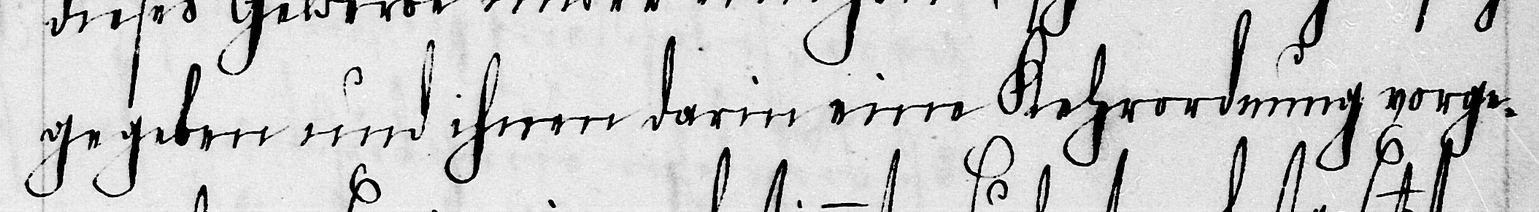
gegeben und ihnen darin eine Kehrordnung vorge¬
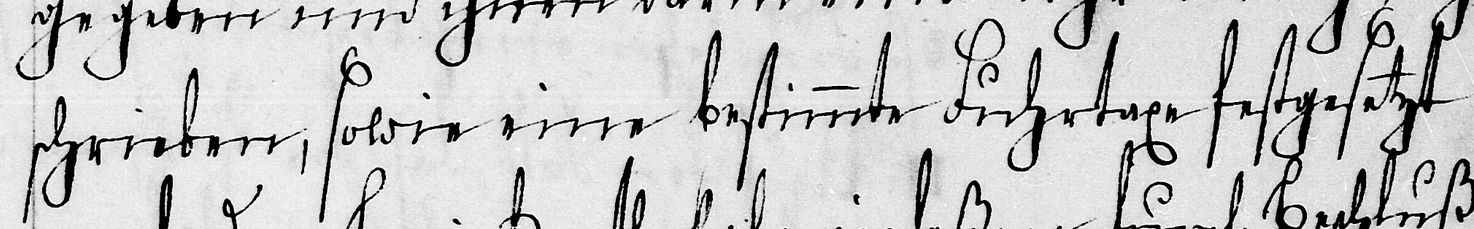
schrieben, sowie eine bestimmte Fuhrtaxe festgesetzt
